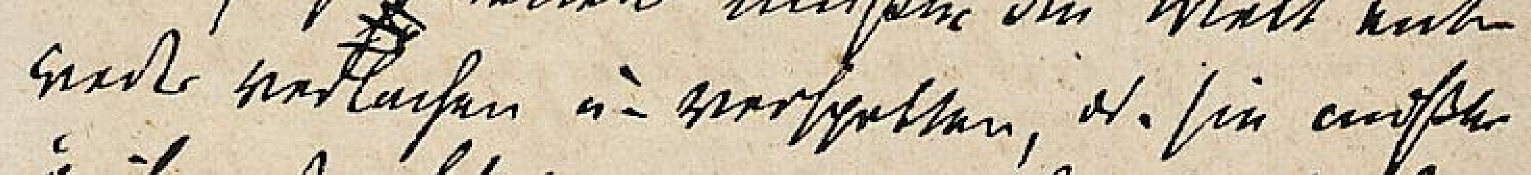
weder verlachen u verspotten, od. sie mußte
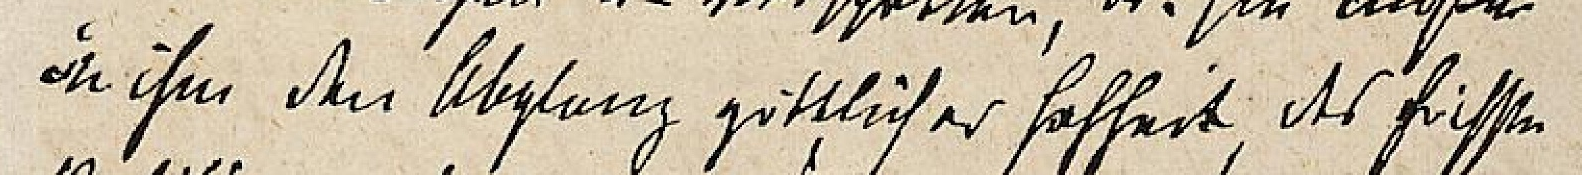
an ihm den Abglanz göttlicher Hohheit, ds höchste
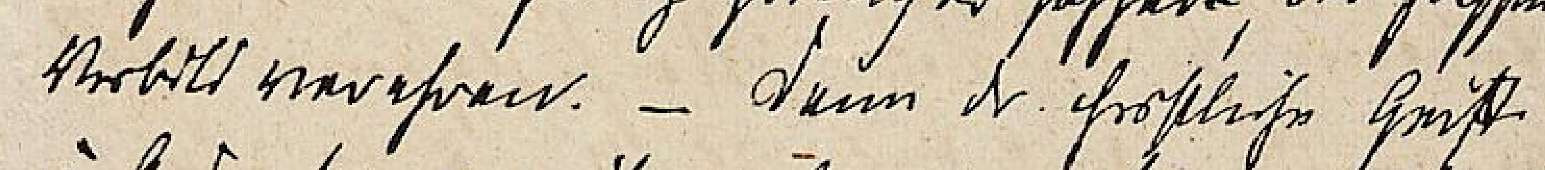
Vorbild verehren. _ Denn dr. christliche Geist
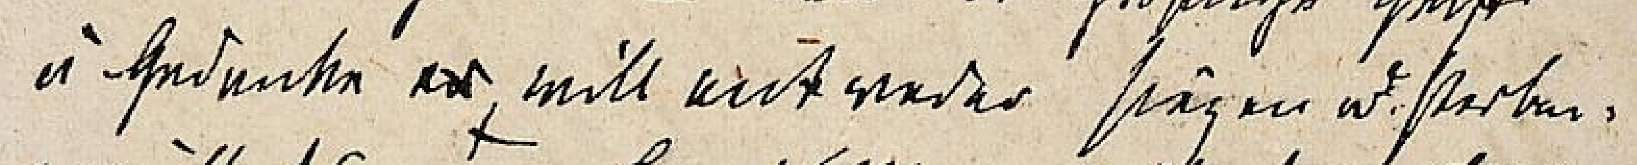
u Gedanke er will entweder siegen od. sterben,
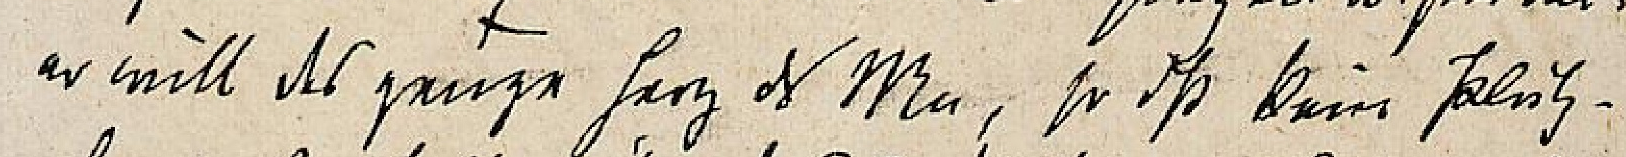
er will das ganze Herz ds Mn, so dß kein Plätz¬
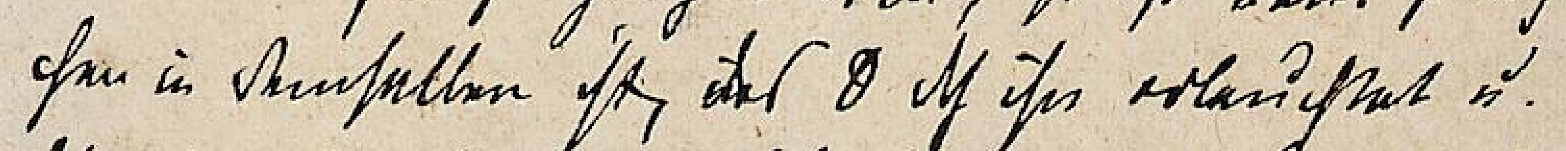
chen in demselben ist, das o dch ihn erleuchtet u
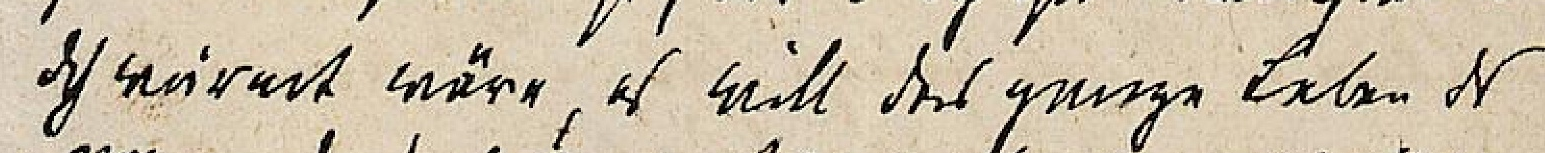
dchwärmt wäre, es will das ganze Leben ds
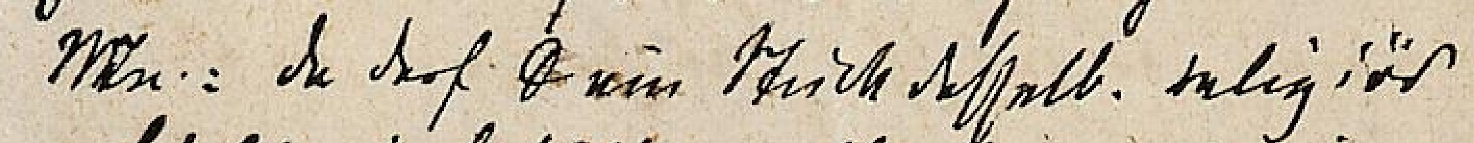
Mn.: da doarf o ein Stück desselb. religiös
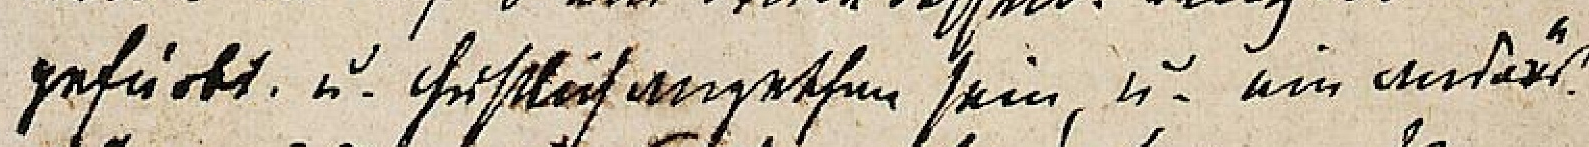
gefärbt u. christlich angethan sein, u. ein anders
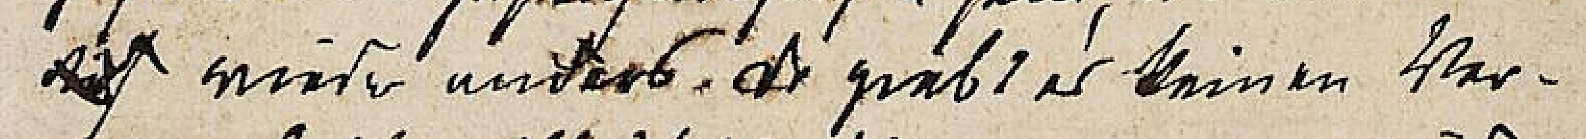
wieder anderes. Da giebt es keinen Ver¬
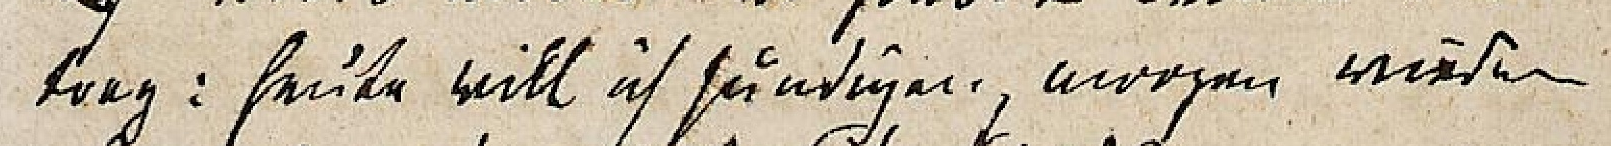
trag: heute will ich sündigen, morgen wieder
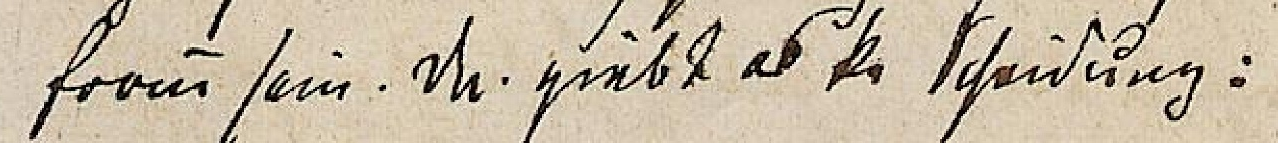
from sein. Da giebt es kn Scheidung:
